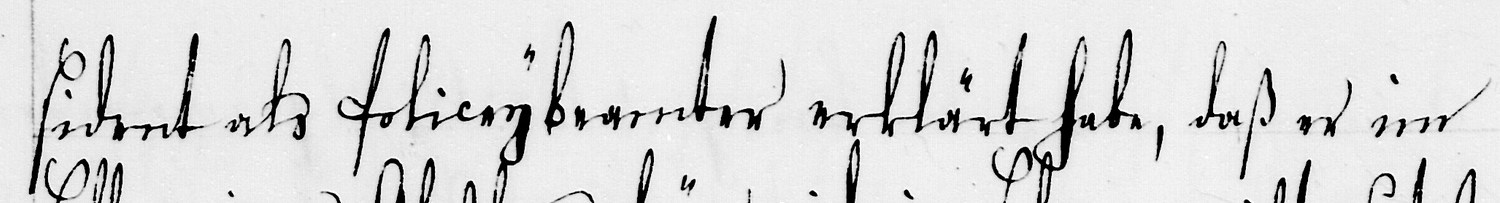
sident als Policeybeamter erklärt habe, daß er im
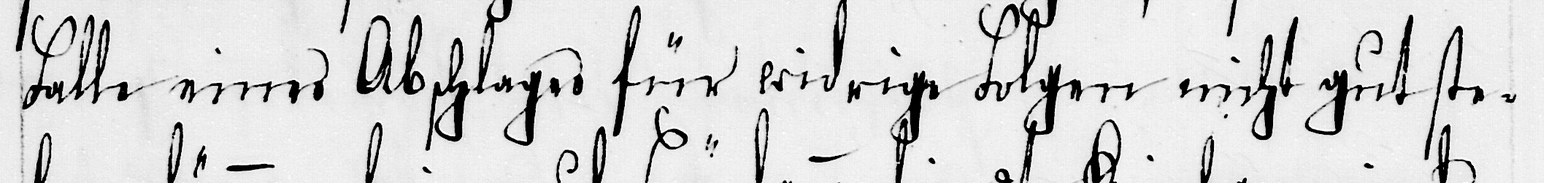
Falle eines Abschlages für widrige Folgen nicht gut ste¬
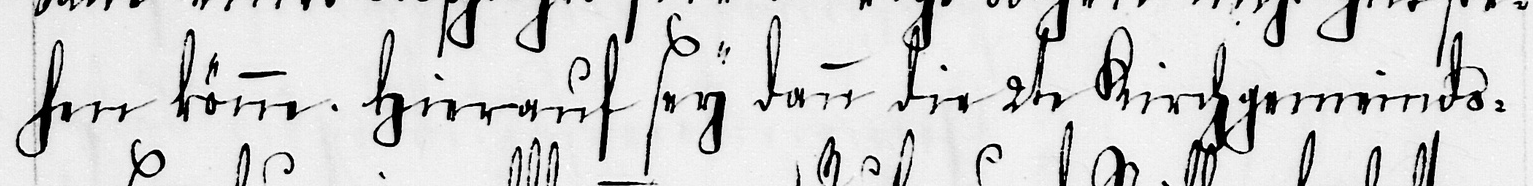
hen könne. Hierauf sey dann die 2te Kirchgemeinds¬
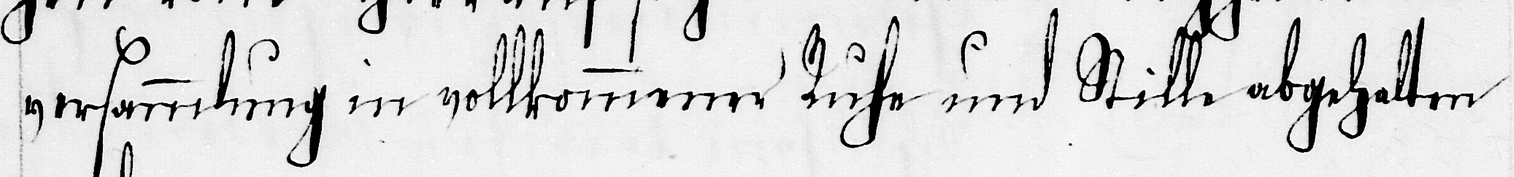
versammlung in vollkommener Ruhe und Stille abgehalten
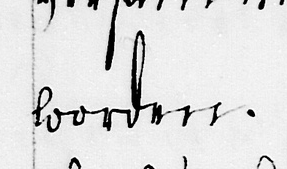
worden.
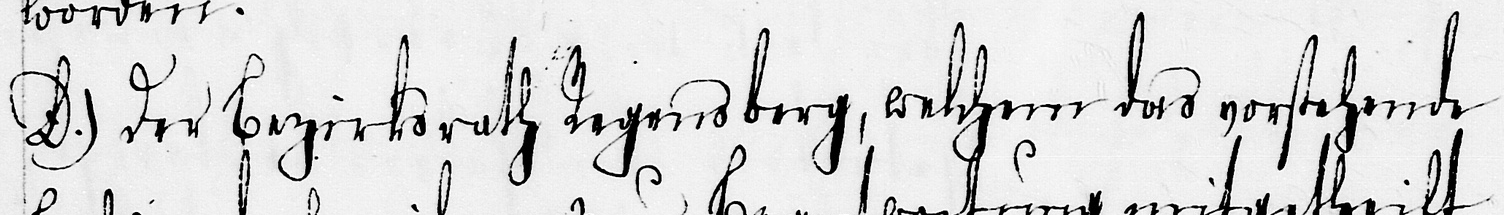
D.) Der Bezirksrath Regensberg, welchem das vorstehende
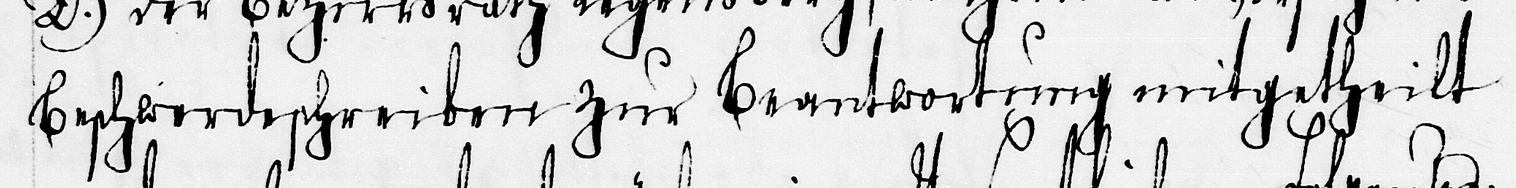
Beschwerdeschreiben zur Beantwortung mitgetheilt
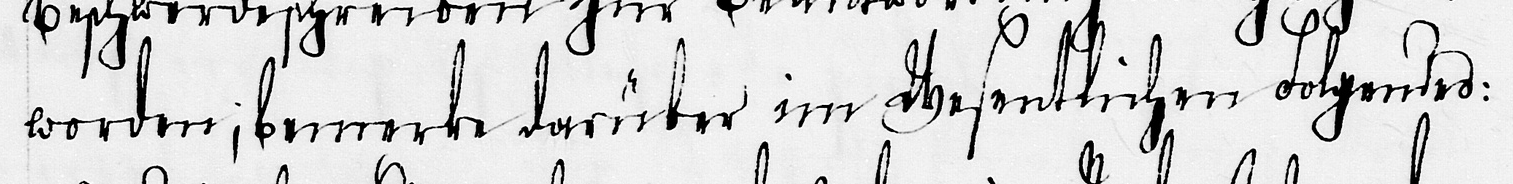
worden, bemerke darüber im Wesentlichen Folgendes:
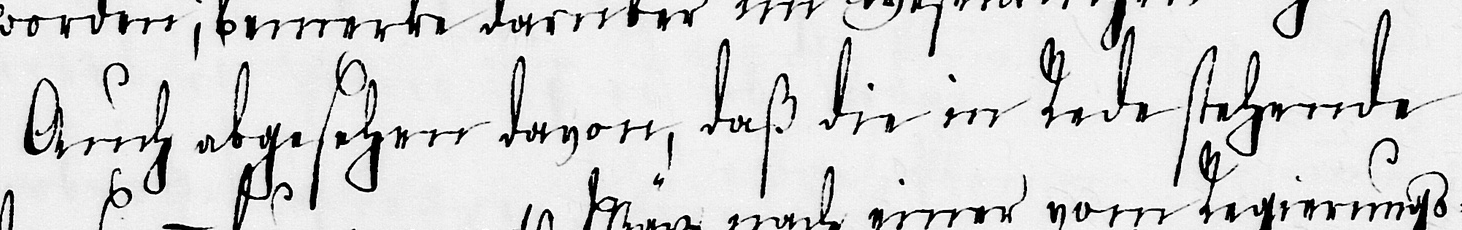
Auch abgesehen davon, daß die in Rede stehende
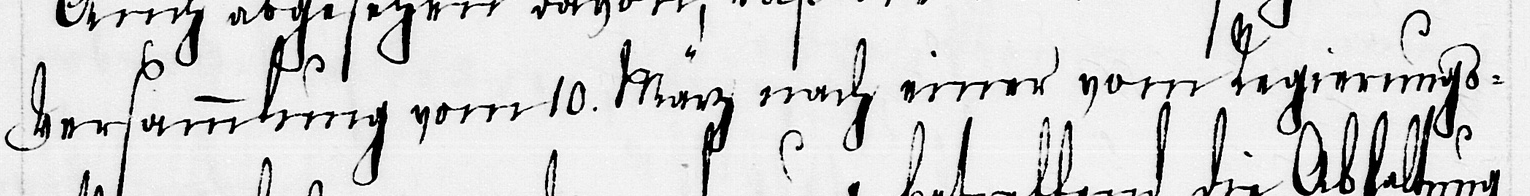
Versammlung vom 10. März nach einer vom Regierungs¬
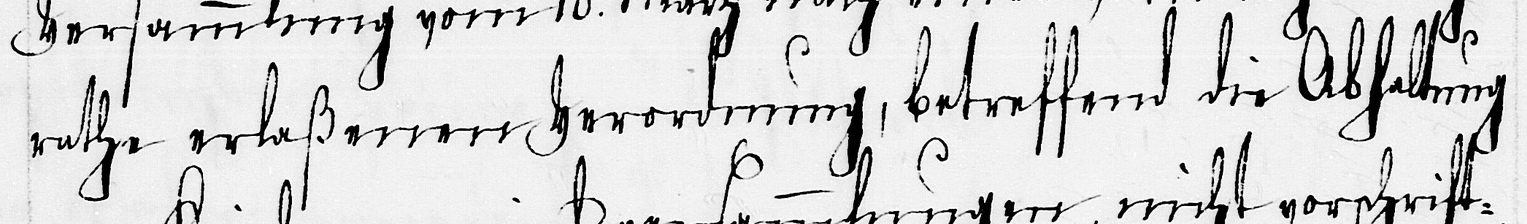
rathe erlaßenen Verordnung, betreffend die Abhaltung
